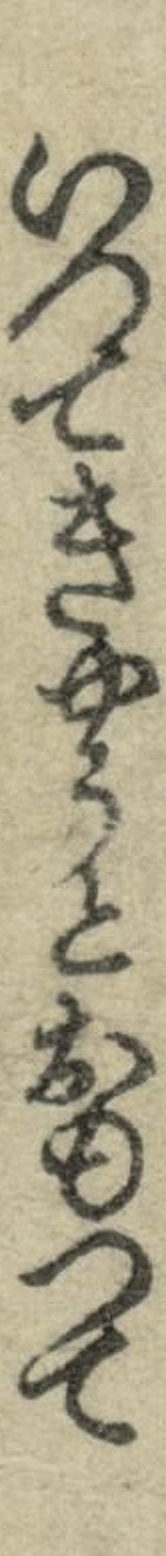いってきやうとおもつて
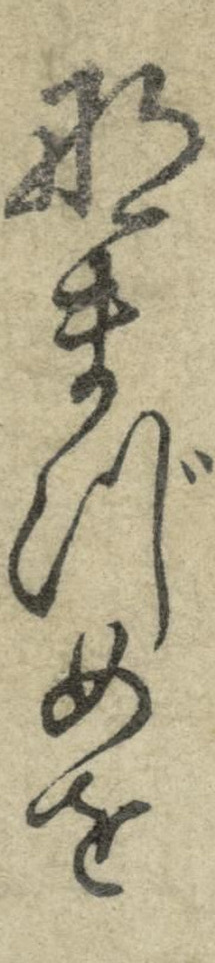なまづめを
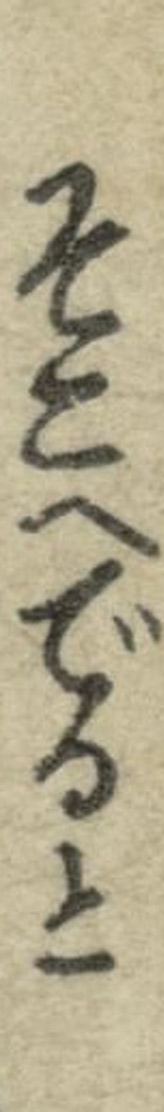そこへでると
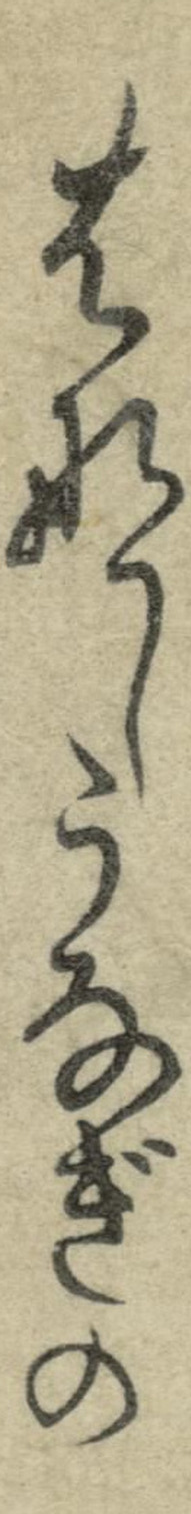はなしうなぎの
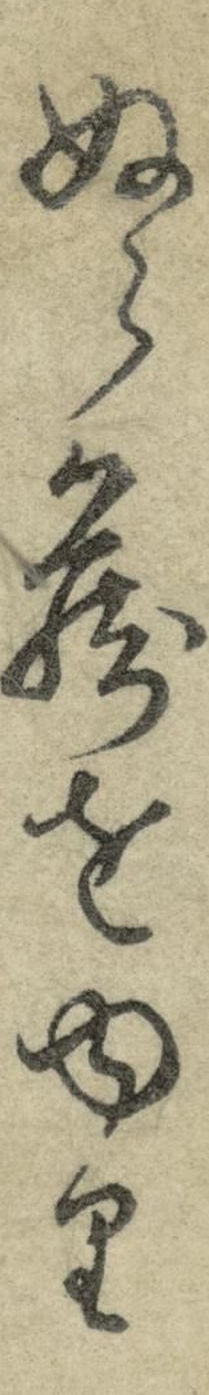ぬら蔵をゆり
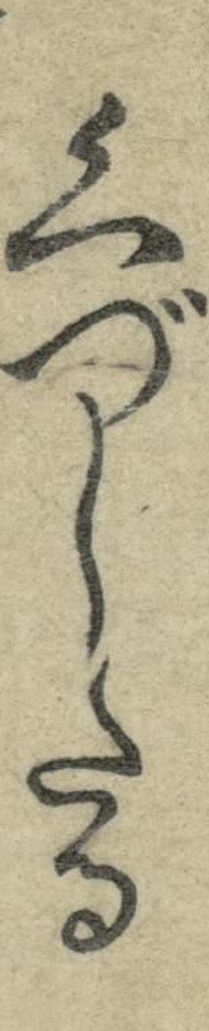くづしたる
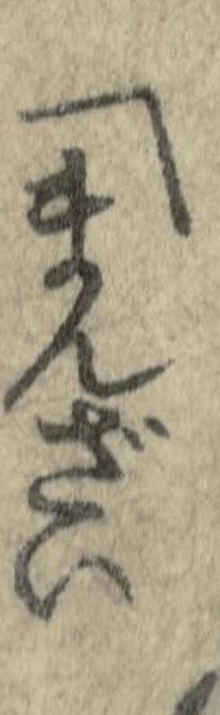〽まんざい
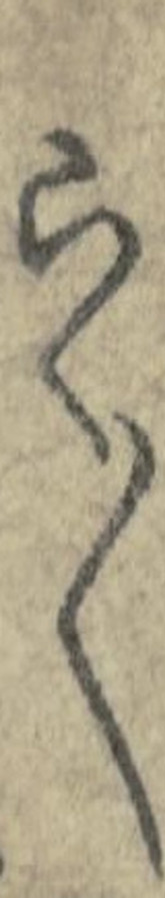らく〳〵
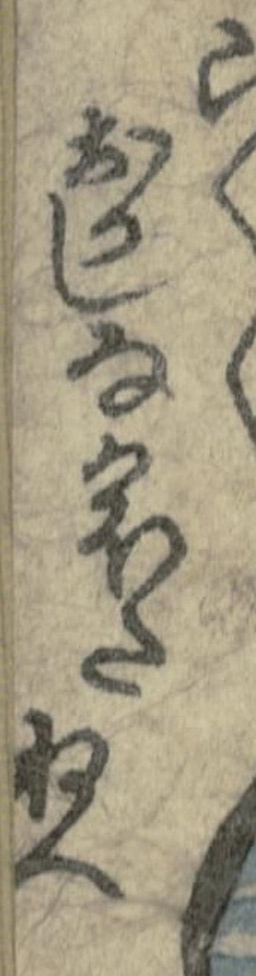おかしな衆たねへ
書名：[首引をする地震鯰と鹿島大明神]
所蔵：東京大学地震研究所図書室 Earthquake Research Institute Library, The University of Tokyo, JAPAN
